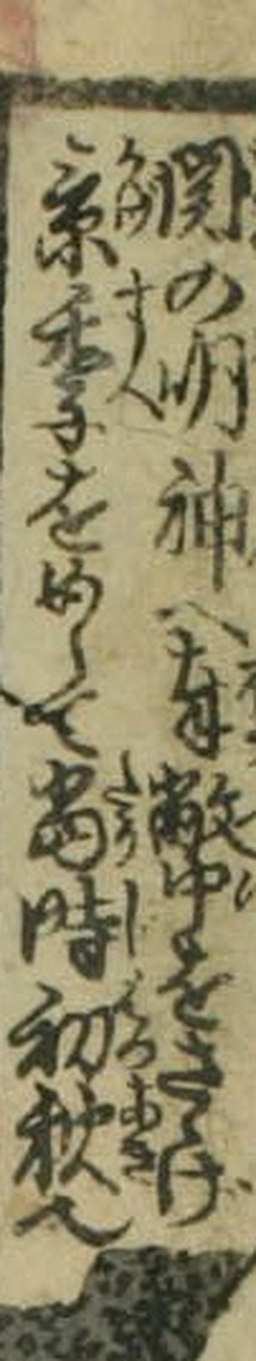景季をめして当時初秋へ
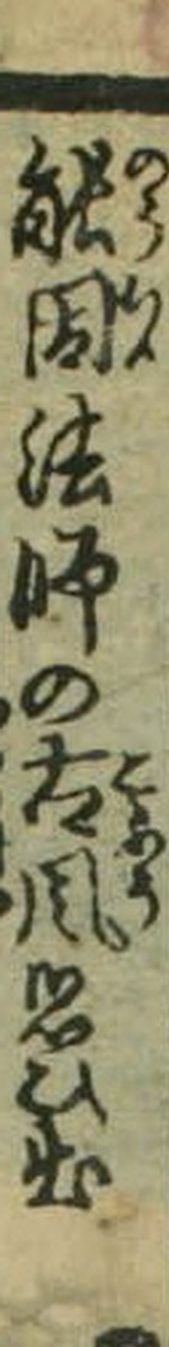能因法師の古風思ひ出
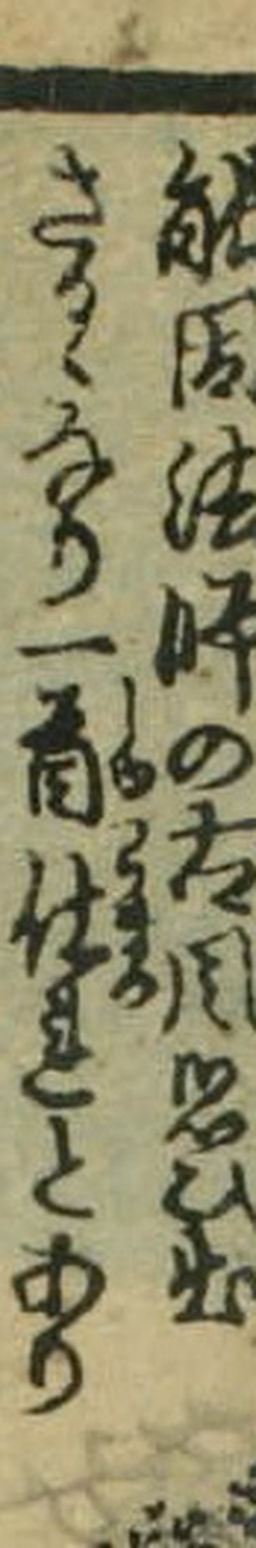さるゝなり一首仕れとあり
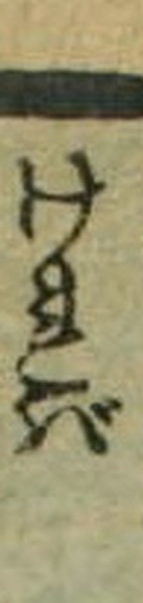ければ
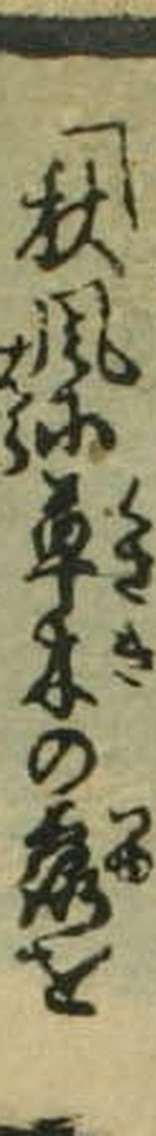〽秋風に草木の露を
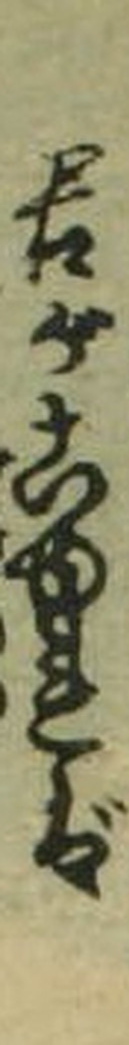君がこゆれば
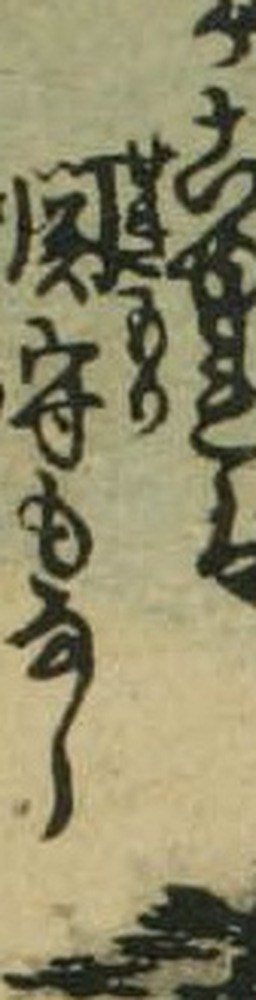関守もなし
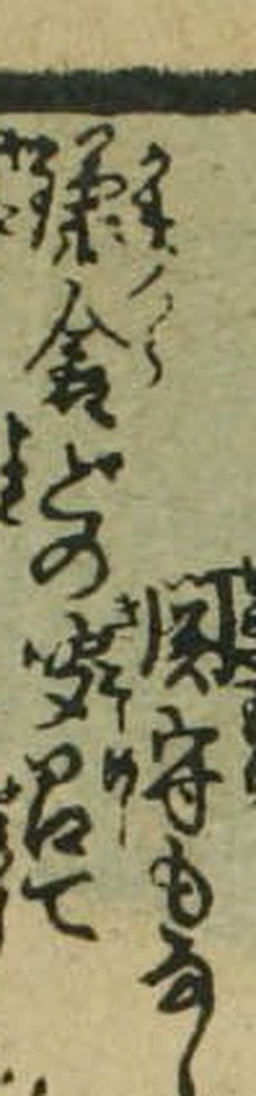鎌倉どの聞召て
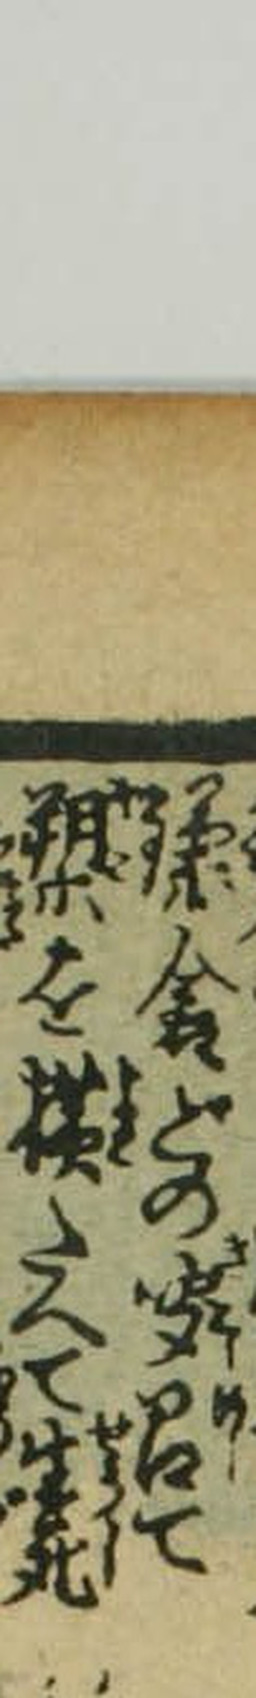槊を横たへて生死
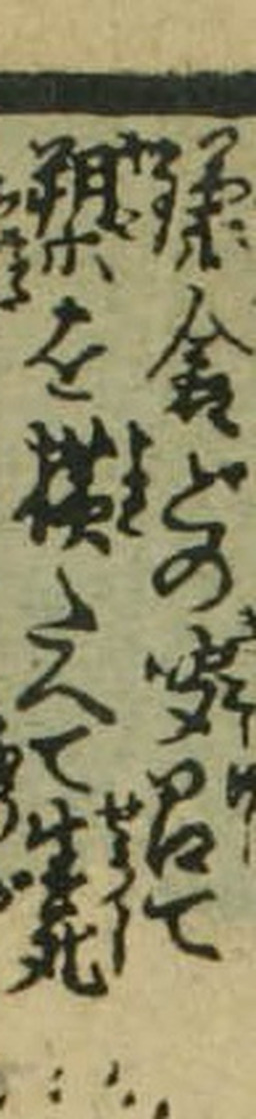槊を横たへて生死
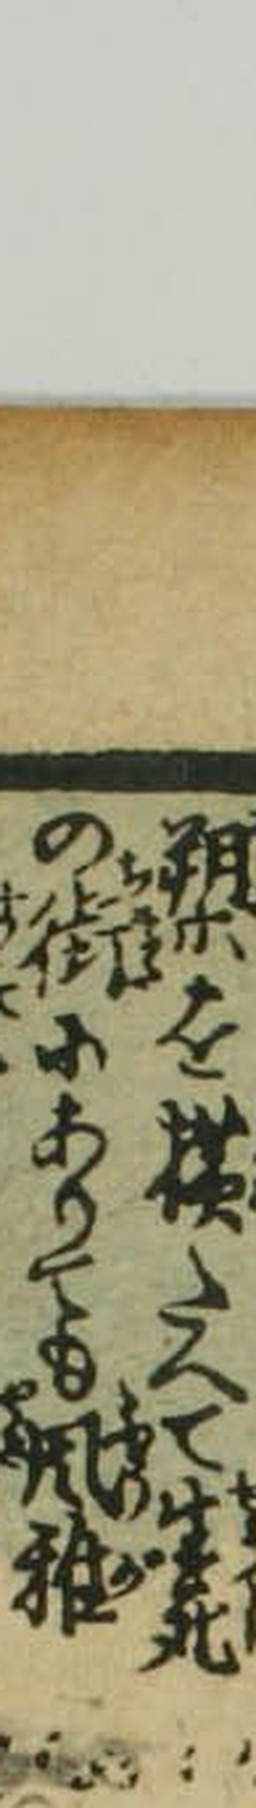の街にありても風雅
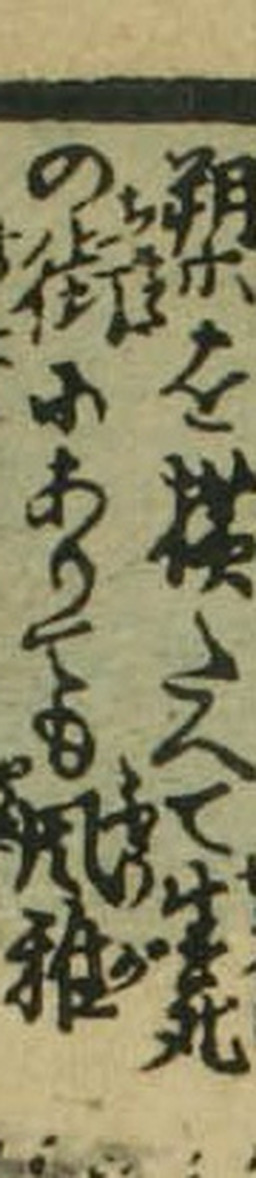の街にありても風雅
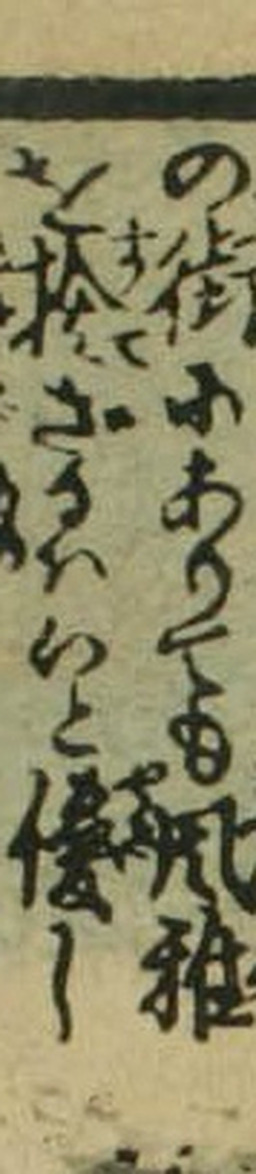を捨ざるはいと優し
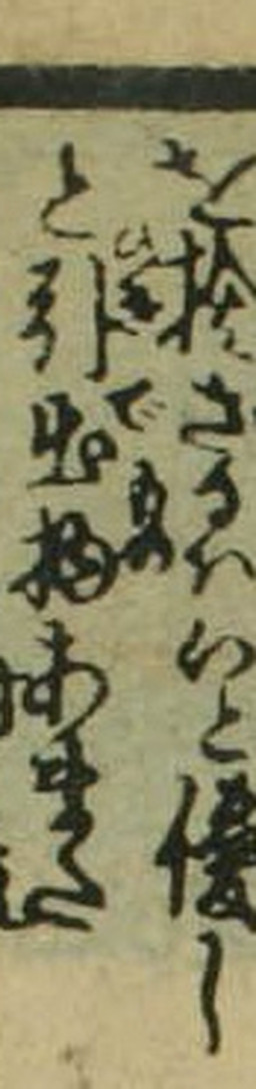と引出物あまた
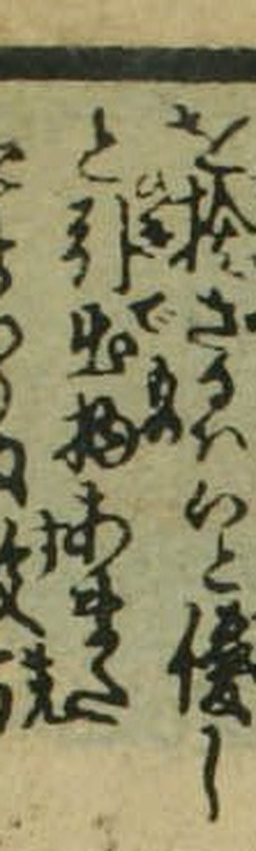と引出物あまた
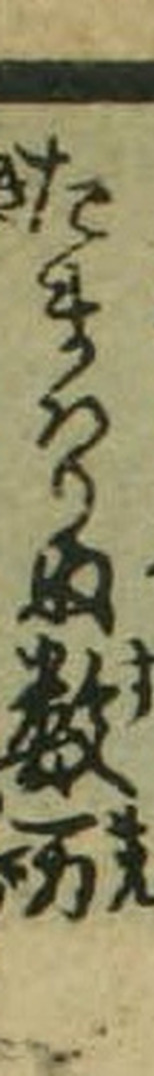たまはりぬ数万
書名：續英雄百人一首
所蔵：東京学芸大学附属図書館
